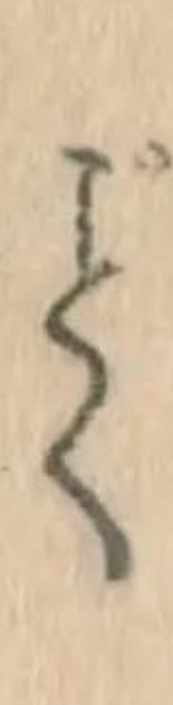ごとく
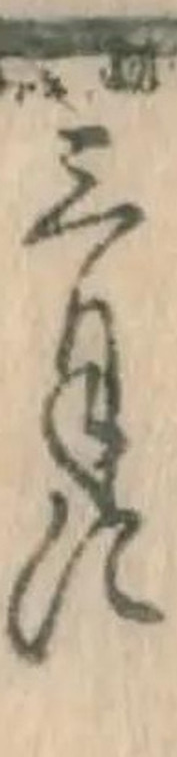三月に
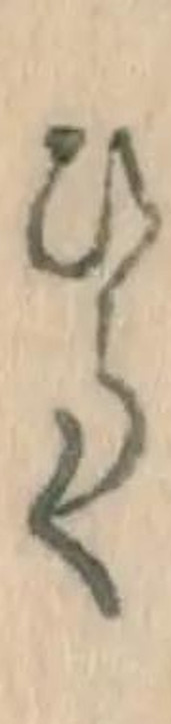ひらく
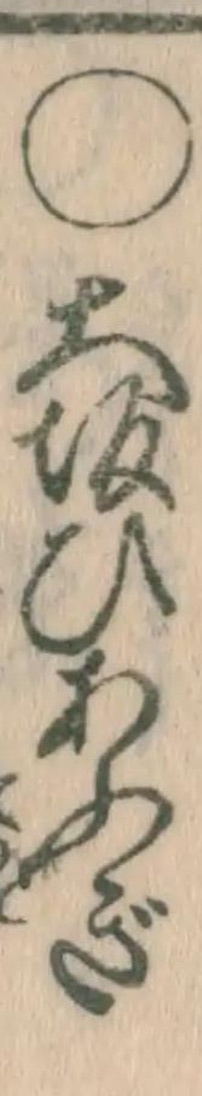〇大阪ひあふぎ
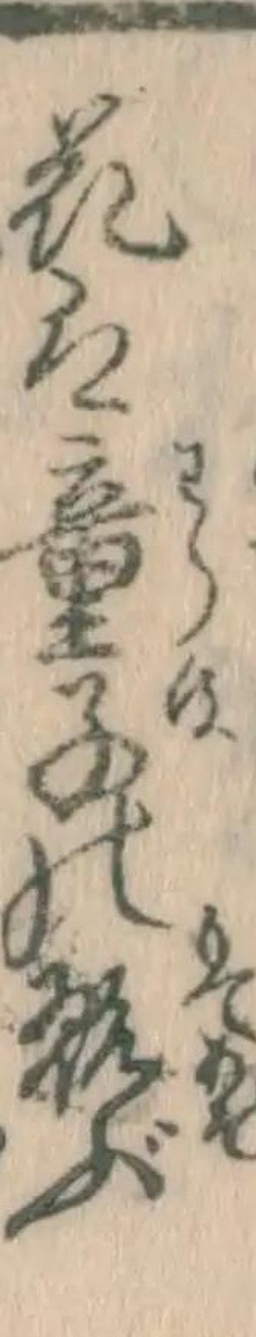花は童子の翫ぶ
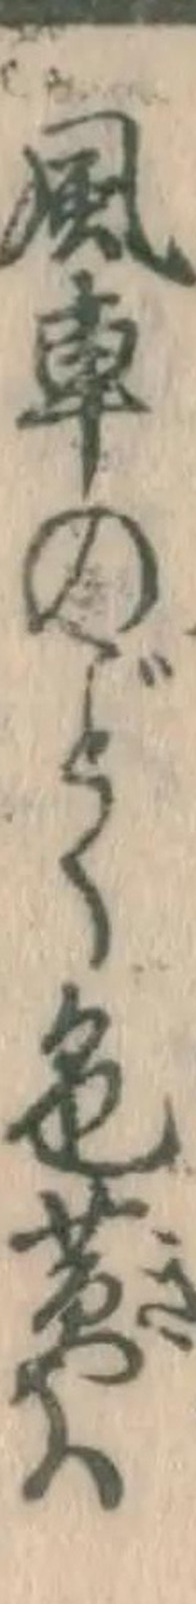風車のごとく色黄に
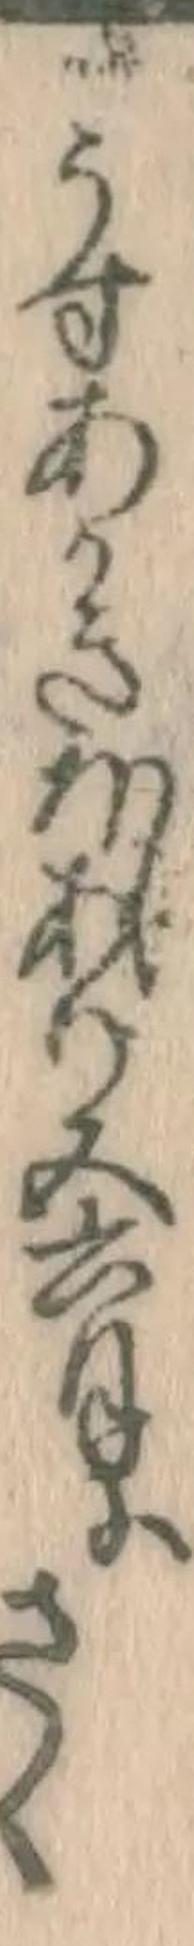うすあかきほあり五六月にさく
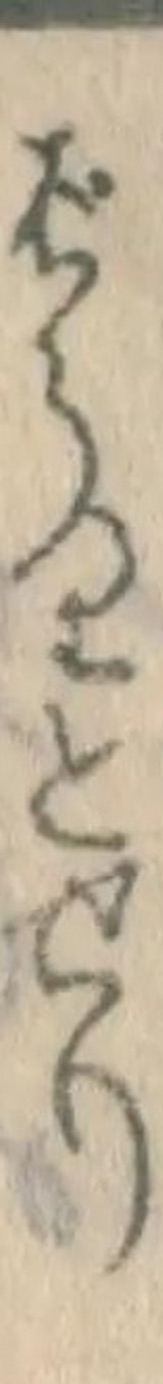ばらりとせり
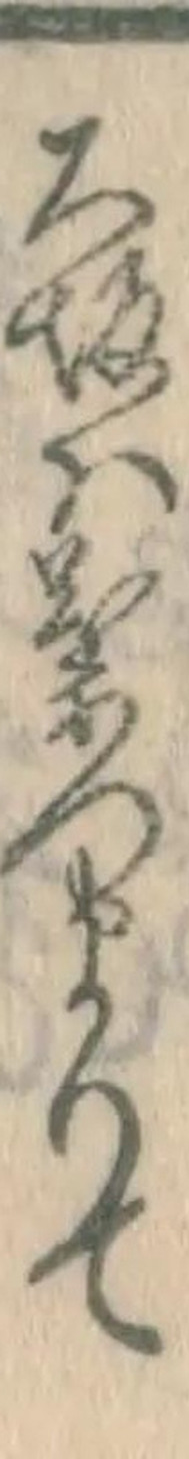大坂は葉つまりて
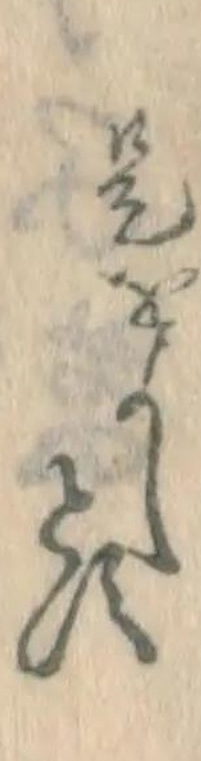是をよしとす

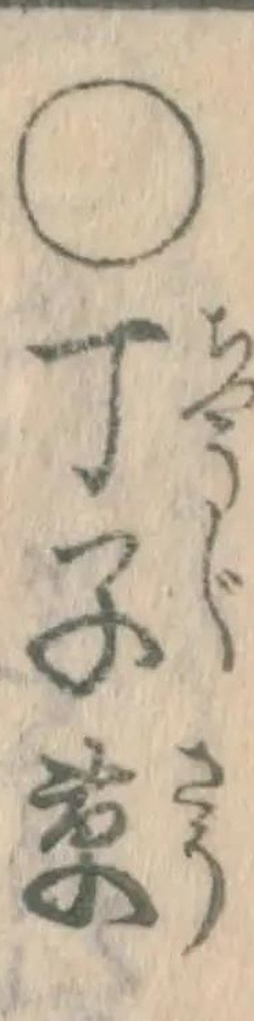〇丁子草
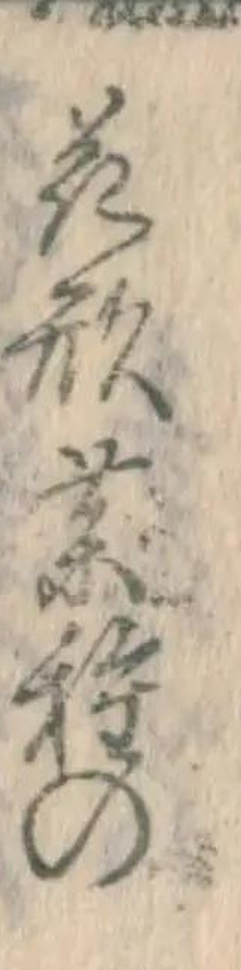花形薬種の
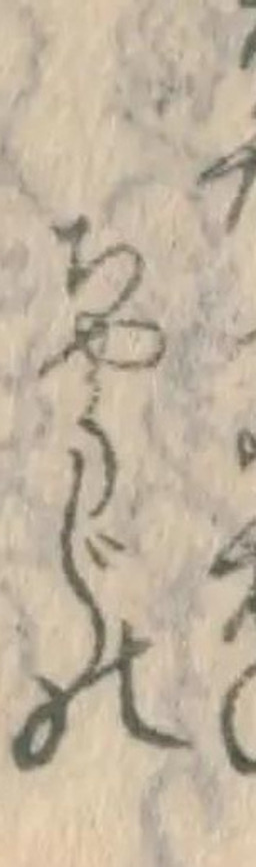ちやうじの
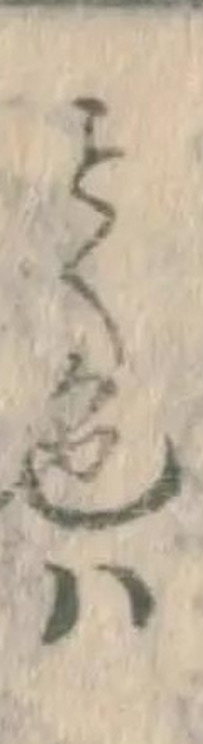ことく色は
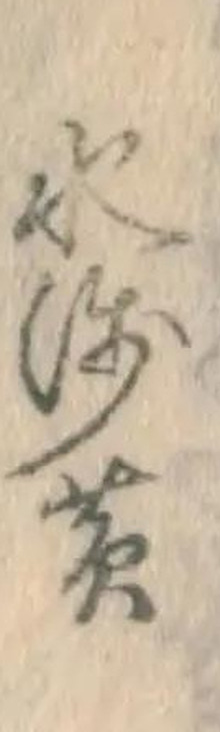水浅黄
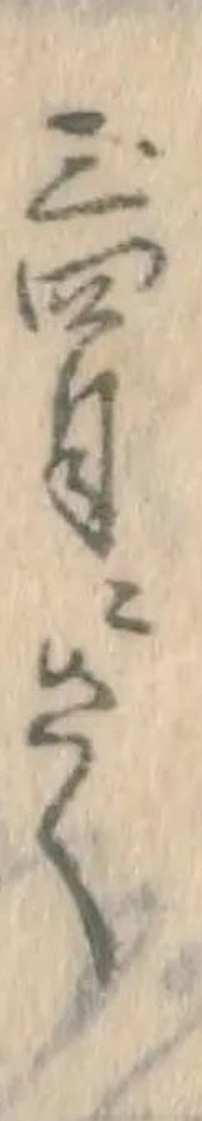三四月にさく
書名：艸花繪前集. [2]
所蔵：国立国会図書館 National Diet Library, JAPAN
